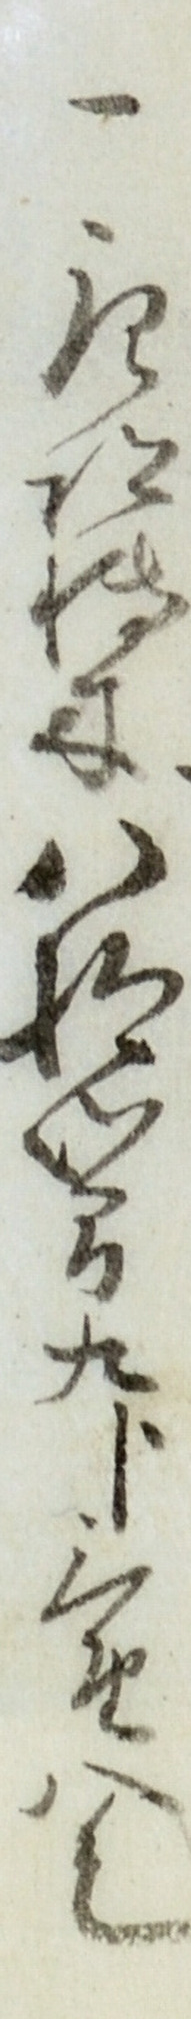一唐松榑木八拾弐間九歩三厘八毛

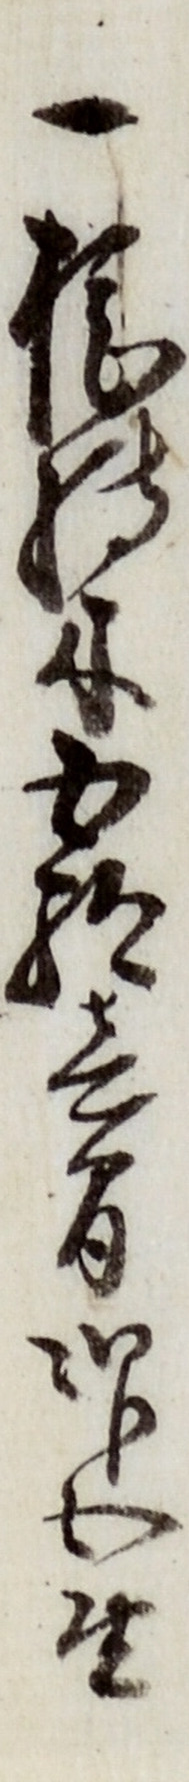一椹榑木五拾壱間弐歩五厘
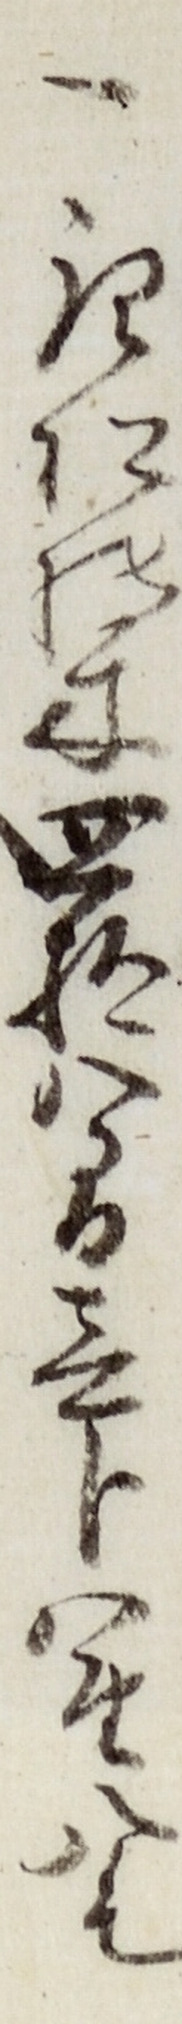一唐松榑木四拾八間壱歩八厘八毛
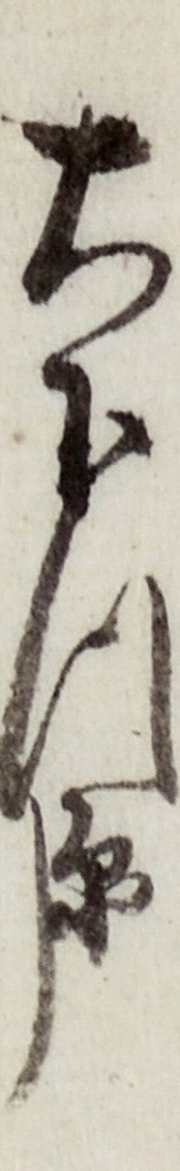右下川原
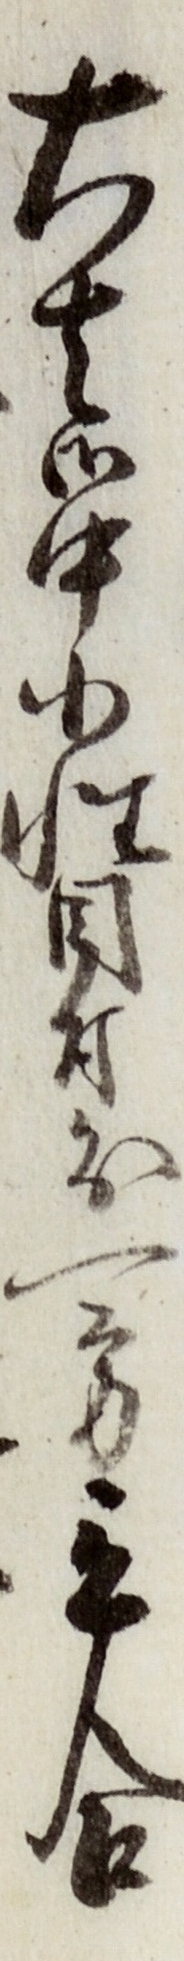右者御中小性目付分一方立合
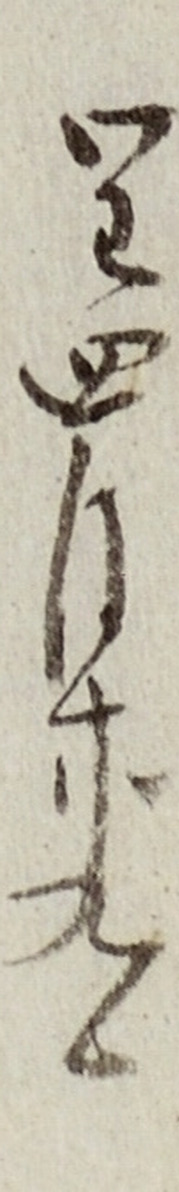閏四月廿九日
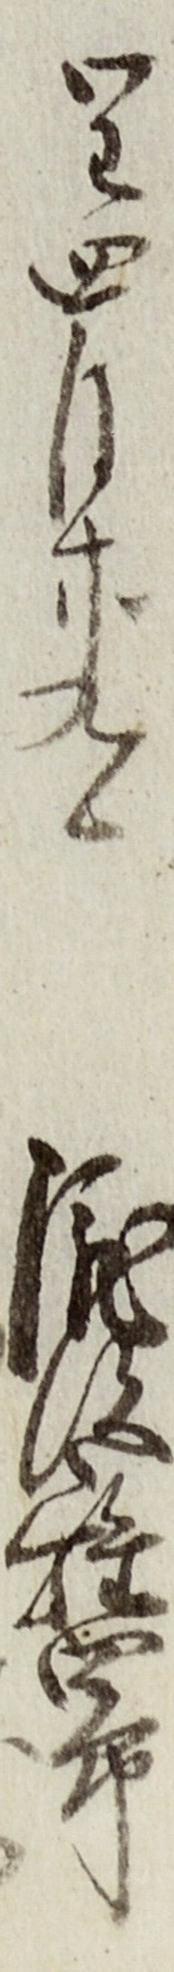閏四月廿九日瀧沢雅四郎
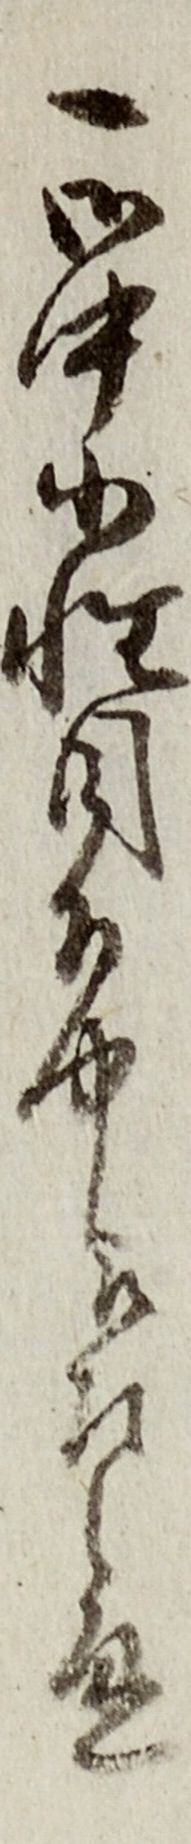一御中小性目付中江左之通
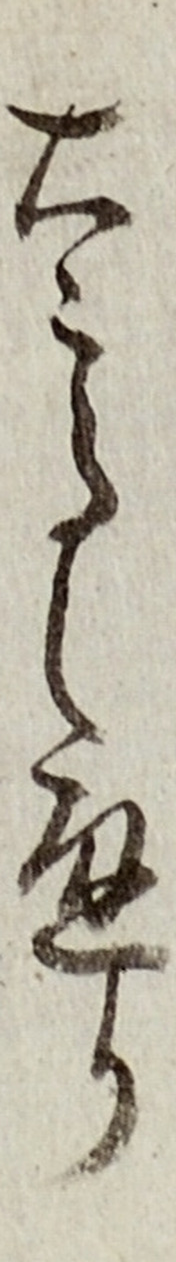右高之通り
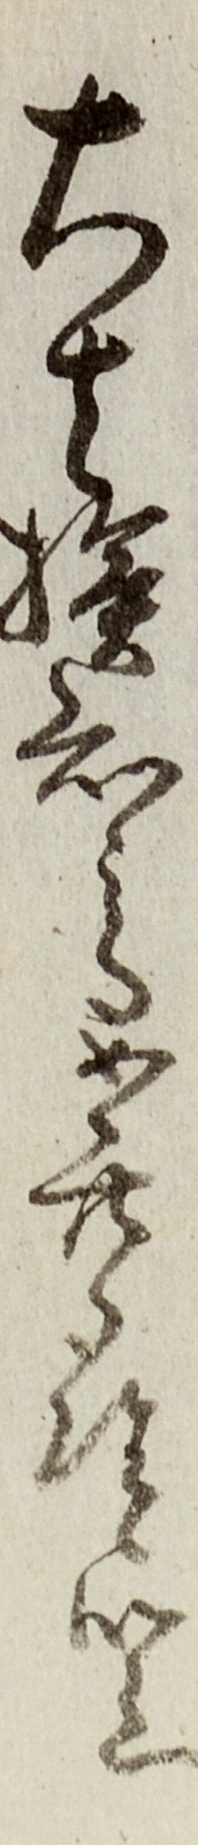右者検知高如此御座候以上
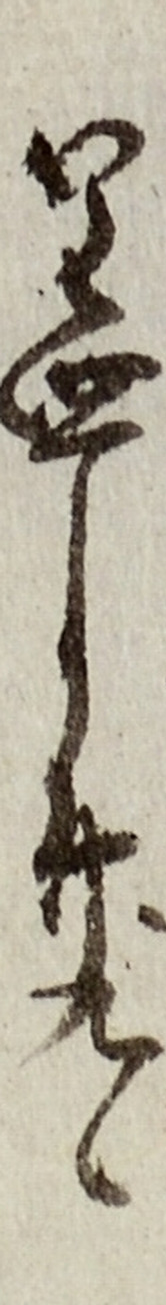閏四月廿九日
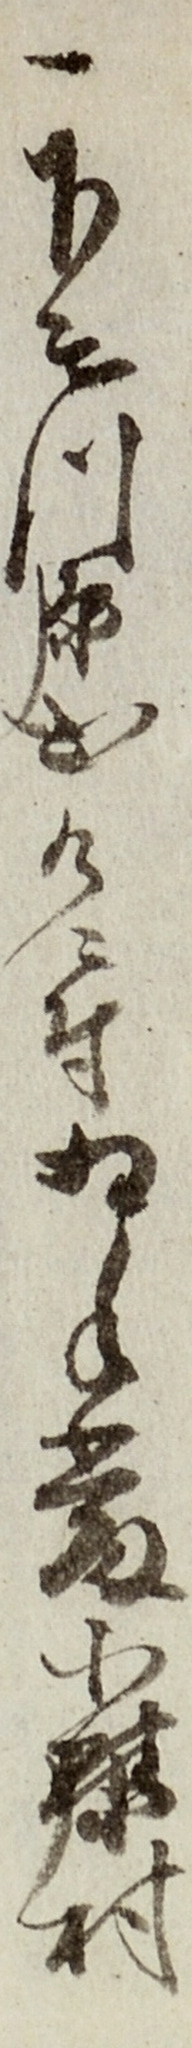一下モ川原出水ニ付為手当小村
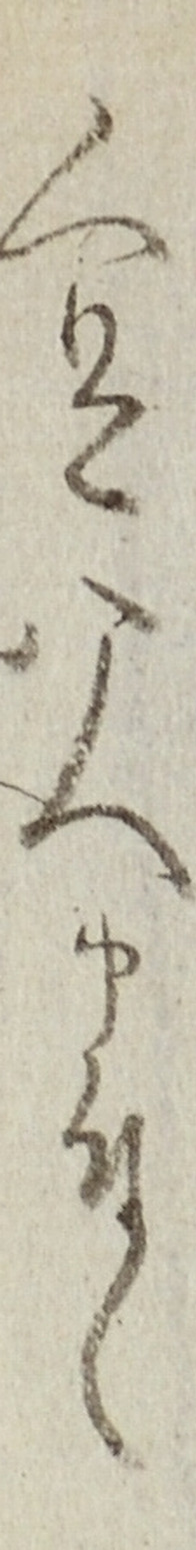人足八人申付候
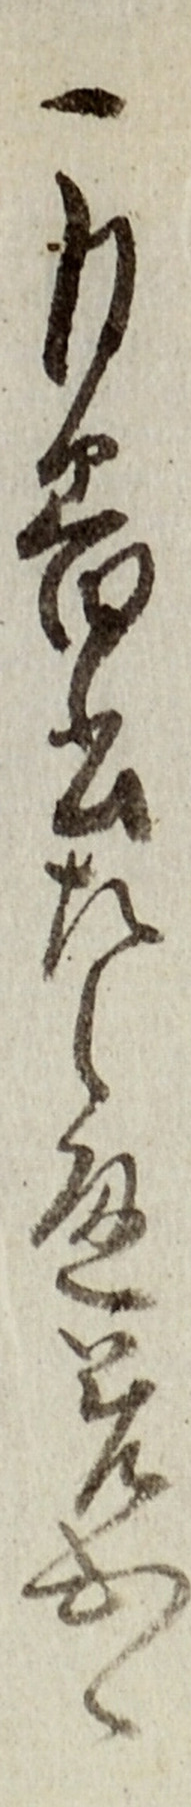一月番書左之通差出候
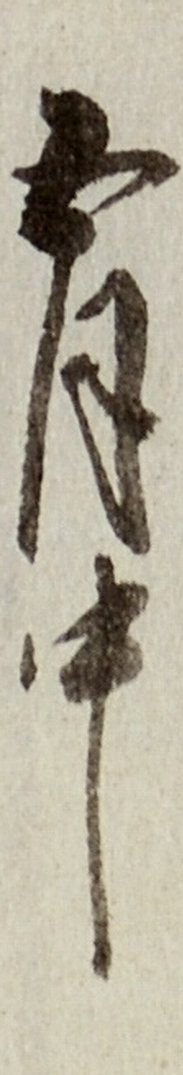五月中
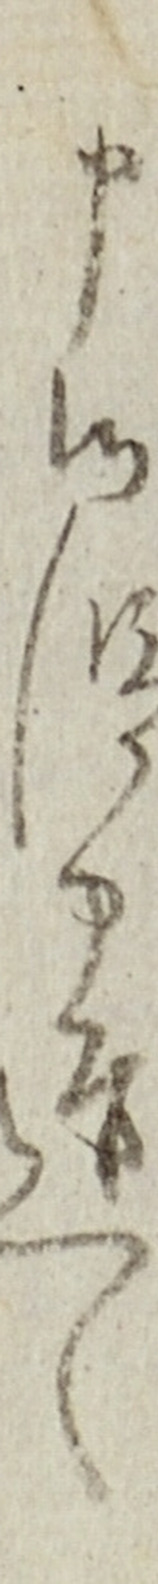申候段申達候
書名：御山方御薪方諸事御用留
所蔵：伊那市立高遠町図書館・合同会社AMANE
